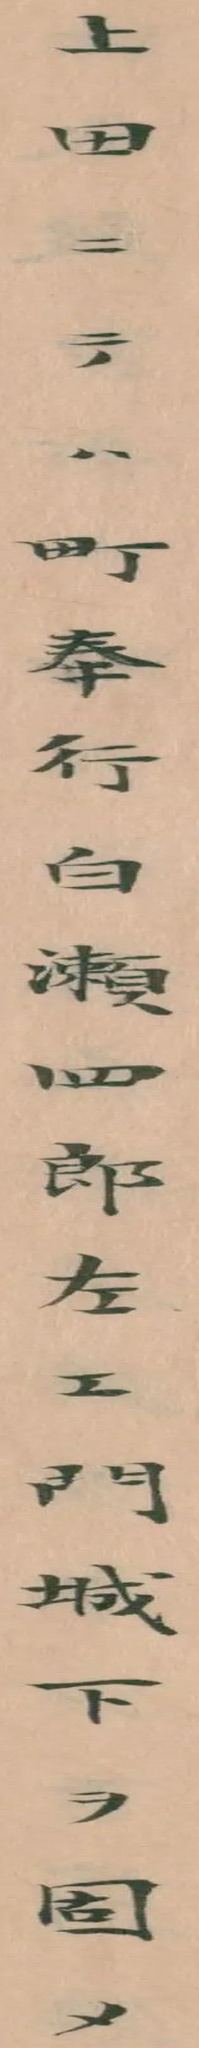上田二テハ町奉行白瀬四郎左衛門城下ヲ固メ
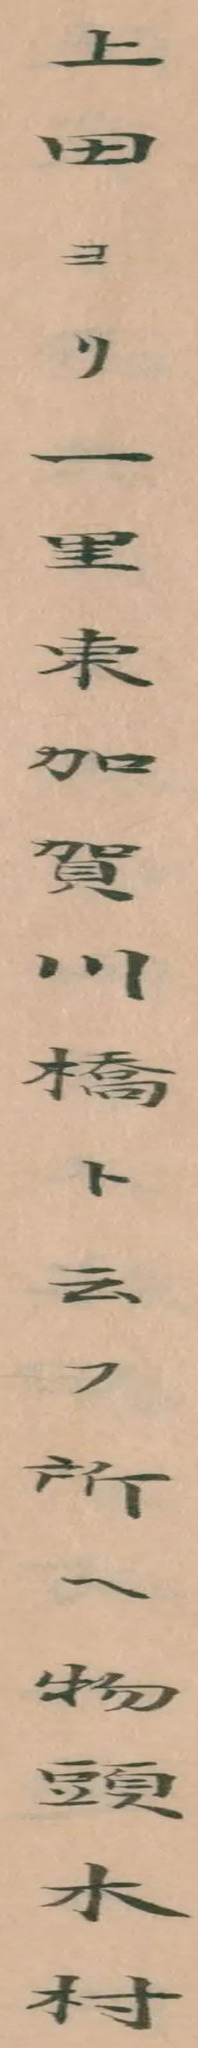上田ヨリ一里東加賀川橋ト云フ所へ物頭木村
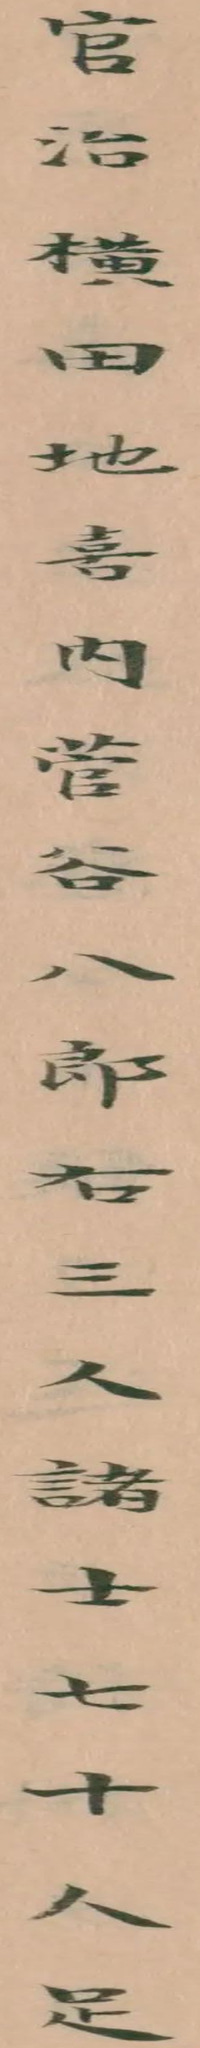官治横田地喜内菅谷八郎右三人諸士七十人足
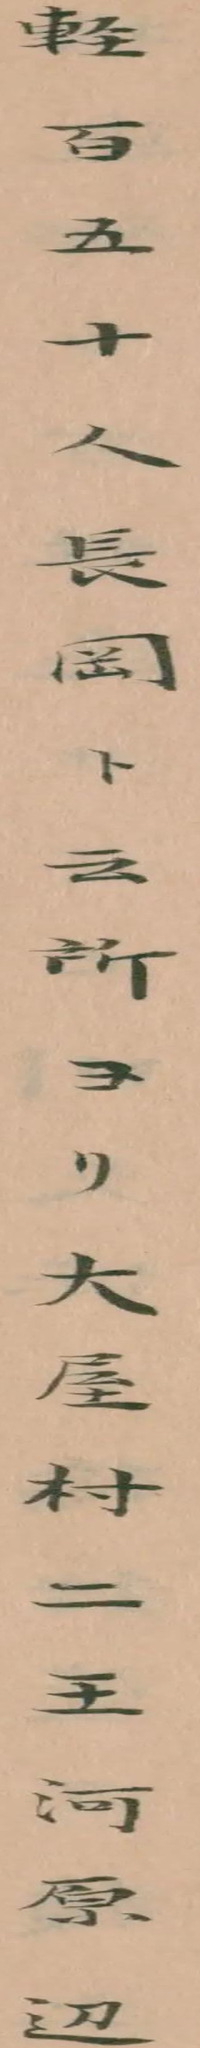軽百五十人長岡ト云所ヨリ大屋村二王河原辺
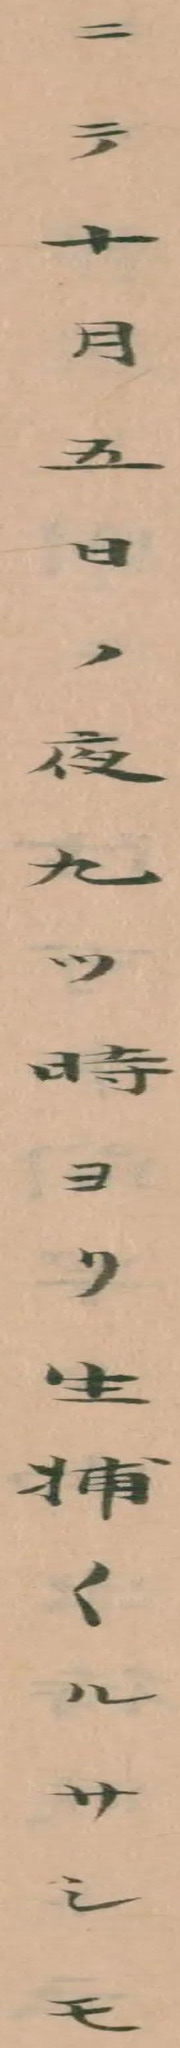二テ十月五日ノ夜九ツ時ヨリ生捕〳〵ルサシモ
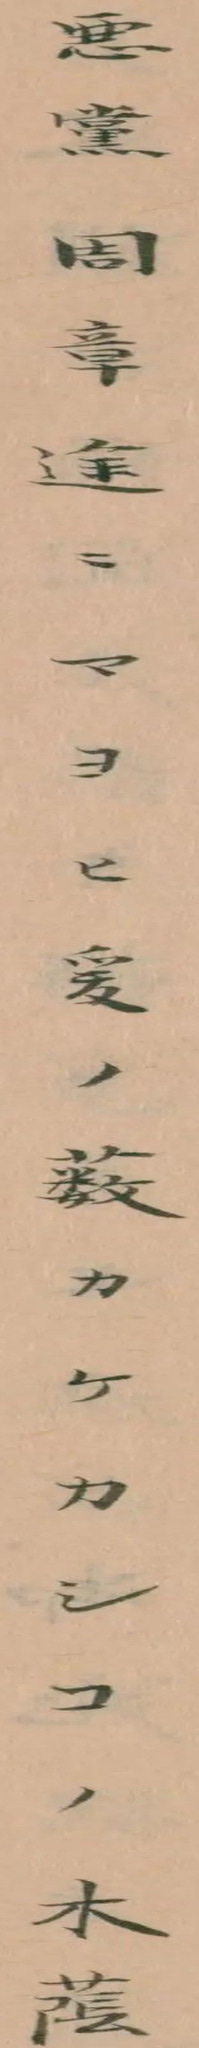悪党周章途二マヨヒ爰ノ藪カケカシコノ木陰
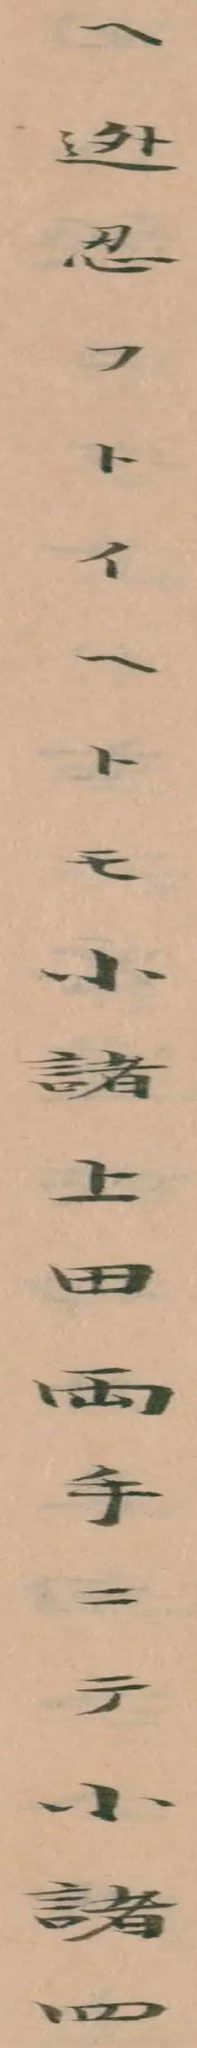へ逃忍フトイへトモ小諸上田両手二テ小諸四
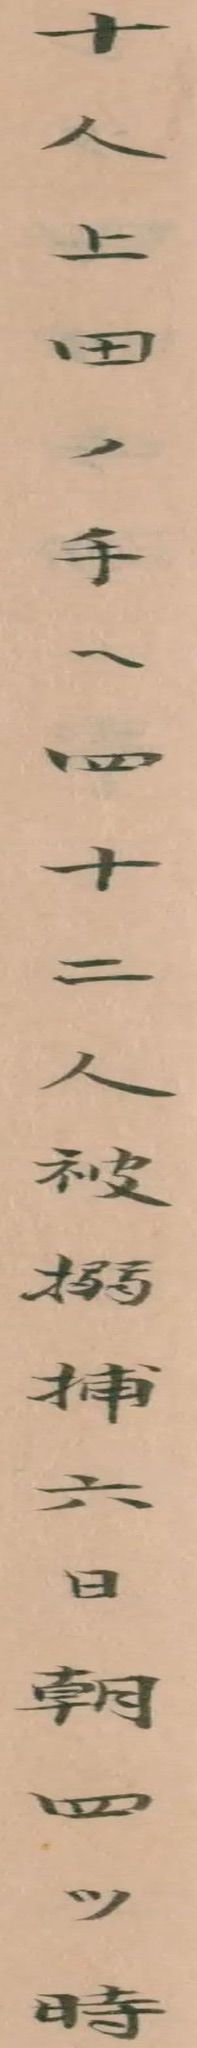十人上田ノ手へ四十二人被搦捕六日朝四ツ時
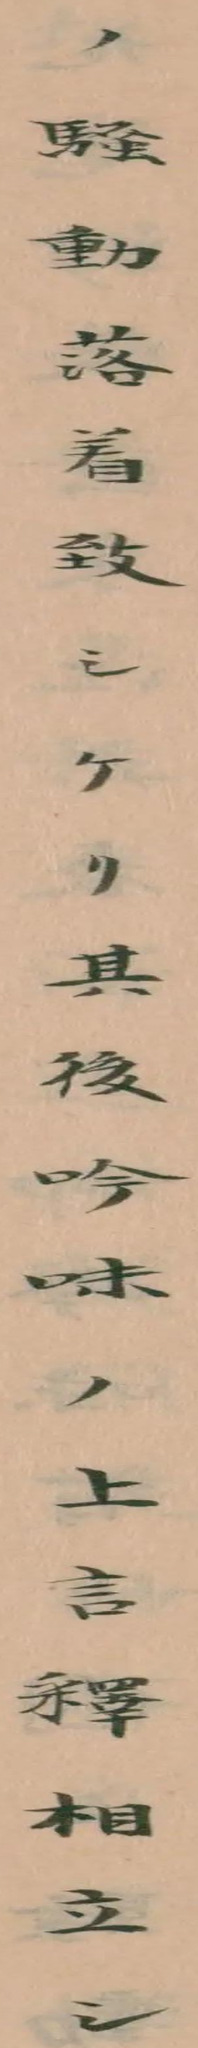ノ騒動落着致シケリ其後吟味ノ上言釈相立シ
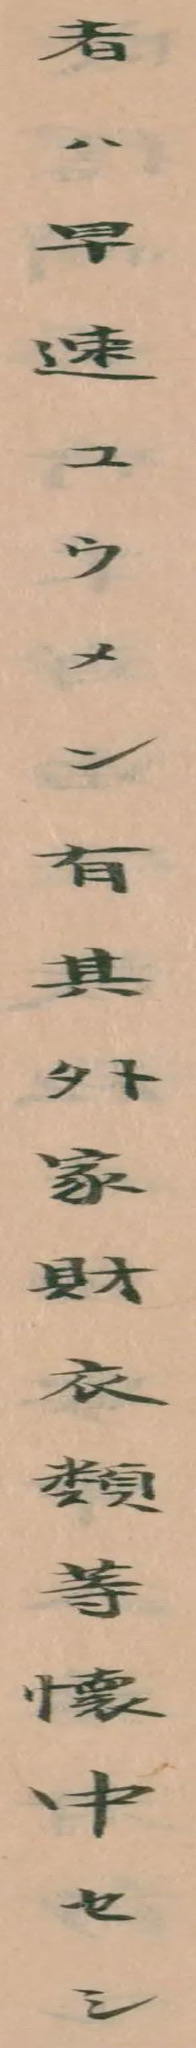者ハ早速ユウメン有其外家財衣類等懐中セシ
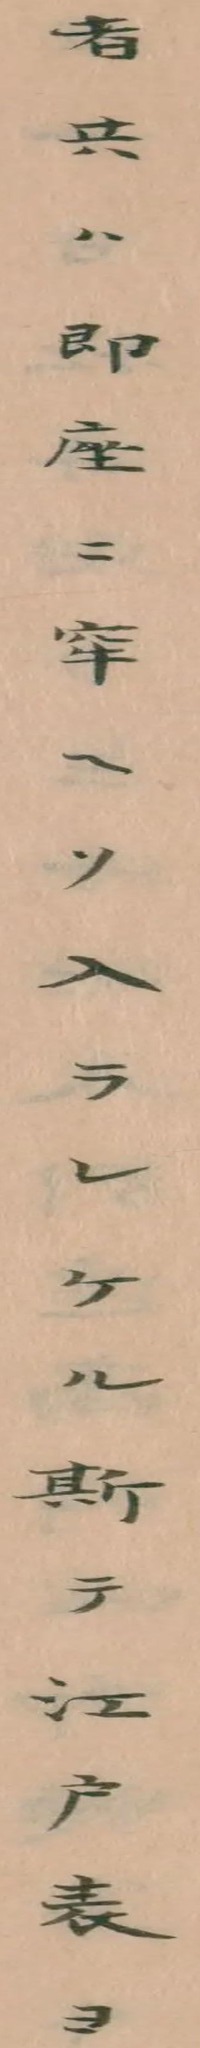者共ハ即座二牢へソ入ラレケル斯テ江戸表ヨ
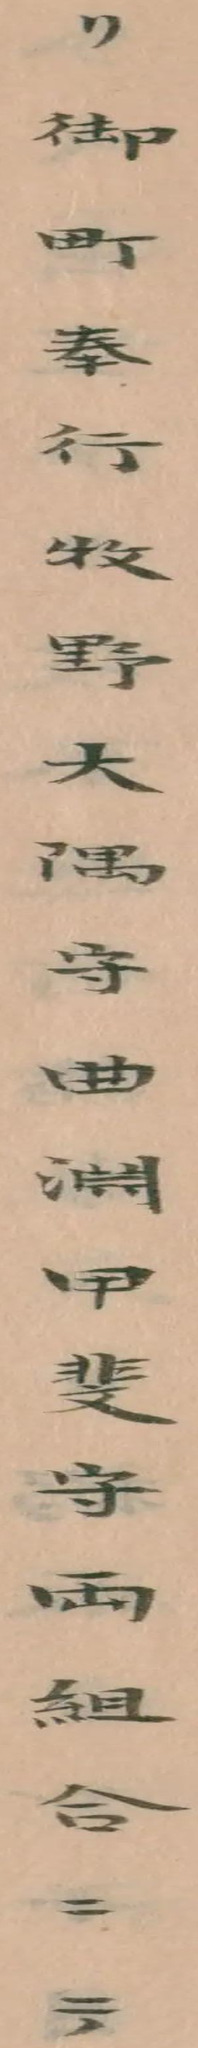リ御町奉行牧野大隅守曲淵甲斐守両組合二テ
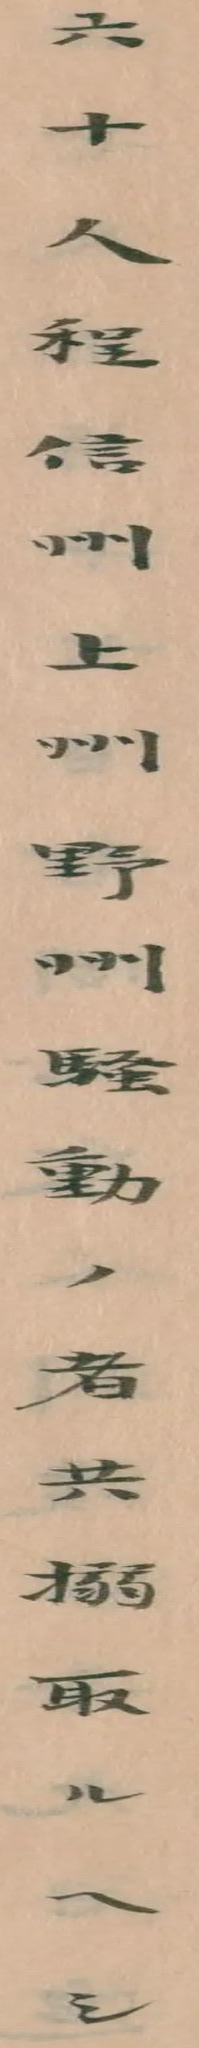六十人程信州上州野州騒動ノ者共搦取ルヘシ
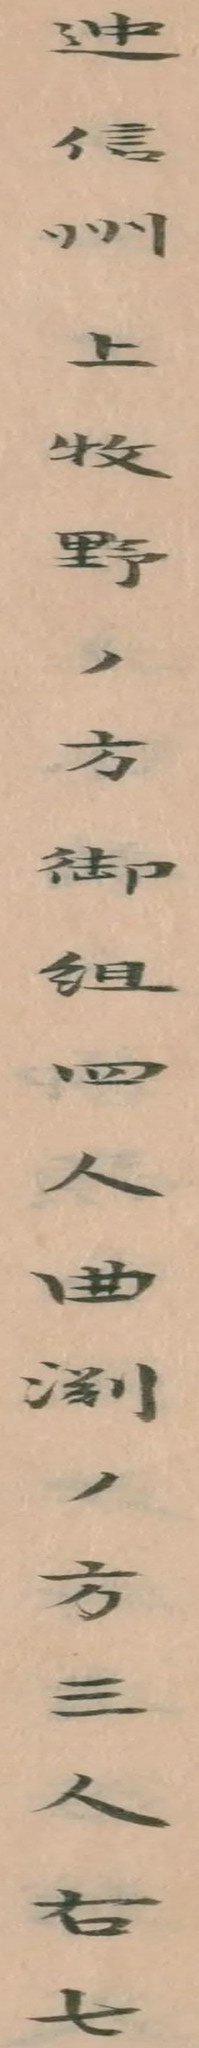迚信州上牧野ノ方御組四人曲淵ノ方三人右七
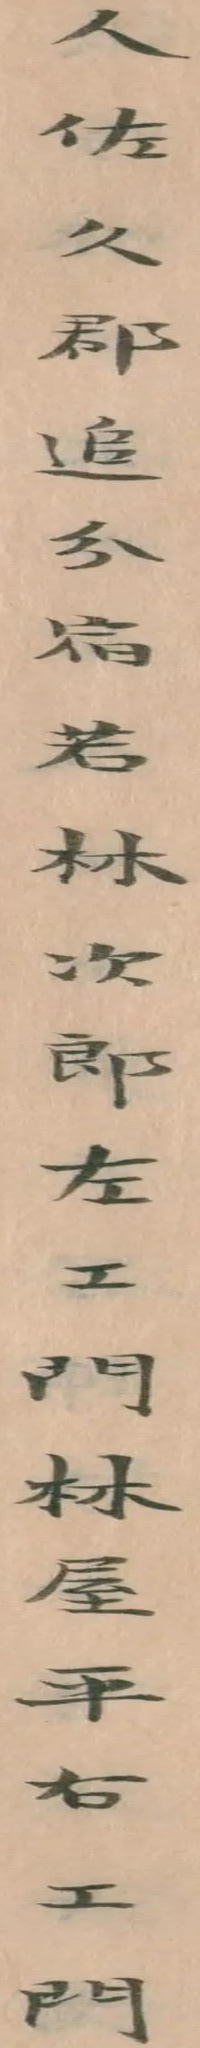人佐久郡追分宿若林次郎左衛門林屋平右衛門
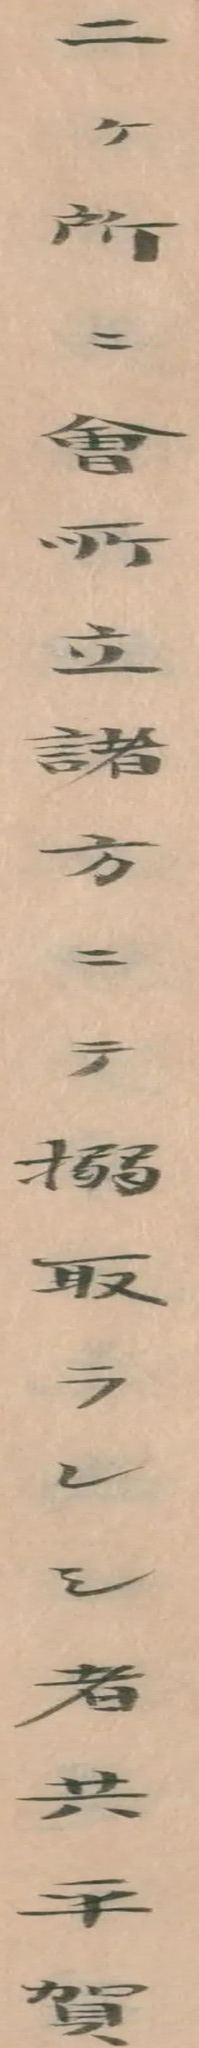二ヶ所二会所立諸方二テ搦取ラレシ者共平賀
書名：地災撮要. 巻3(地震之部)-巻4(噴火之部)
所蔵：国立国会図書館 National Diet Library, JAPAN
